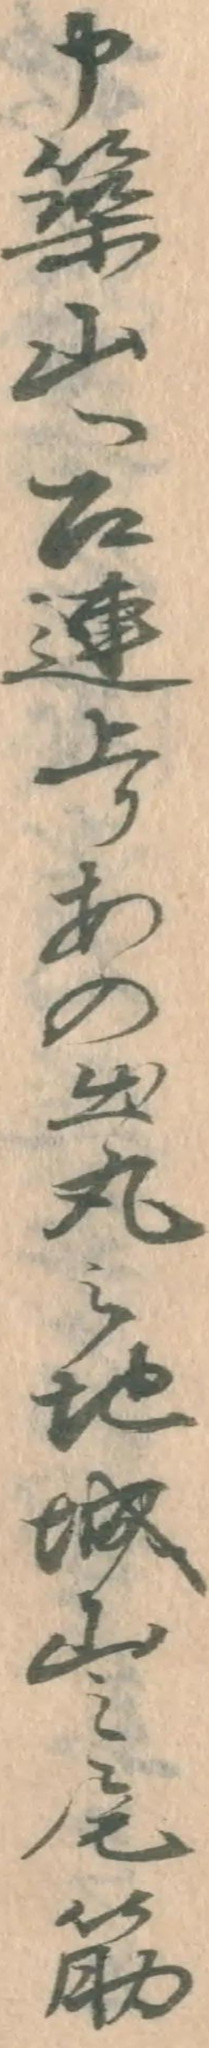申築山へ召連上りあの出丸之地城山之尾筋
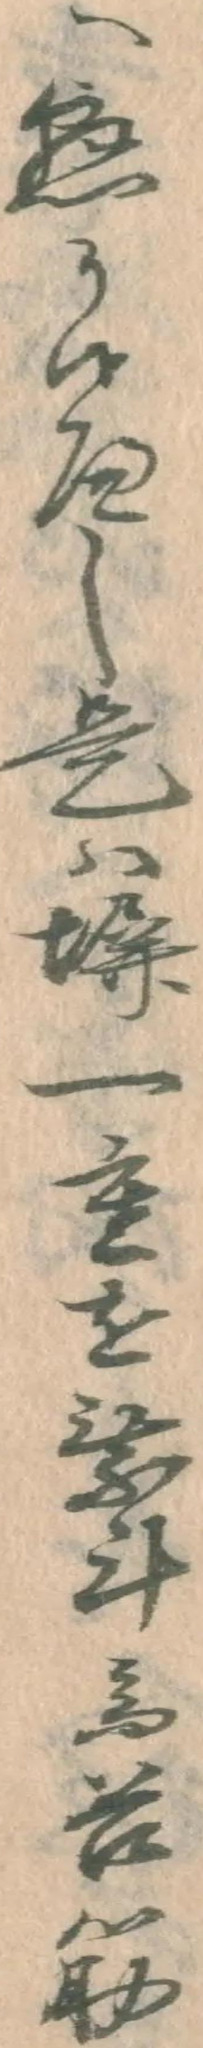へ懸り候扁し是は塀一重を乗斗に而谷筋
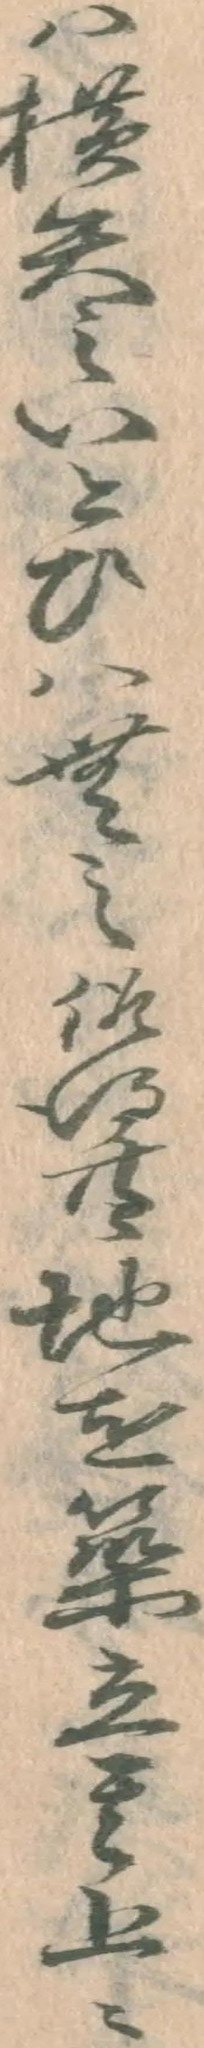は横矢之いとひは無之候得共地を築立其上に
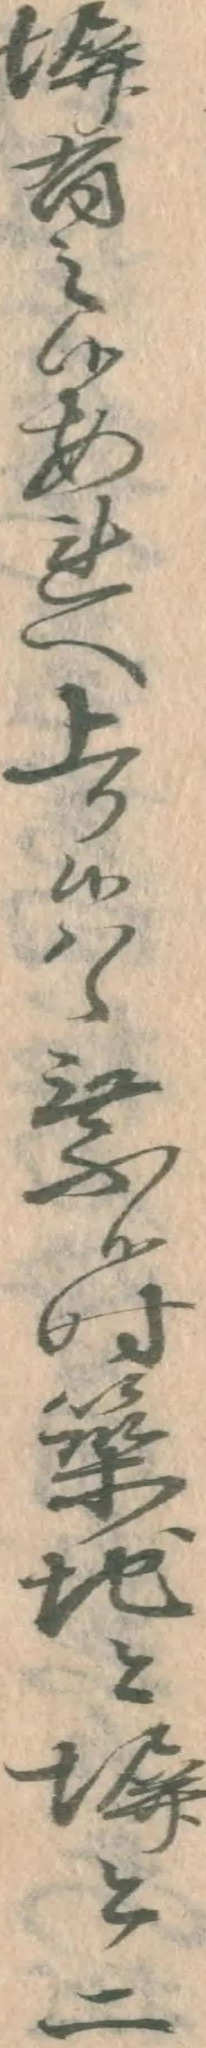塀有之候あ連へ上り候はゝ乗候時築地と塀と二
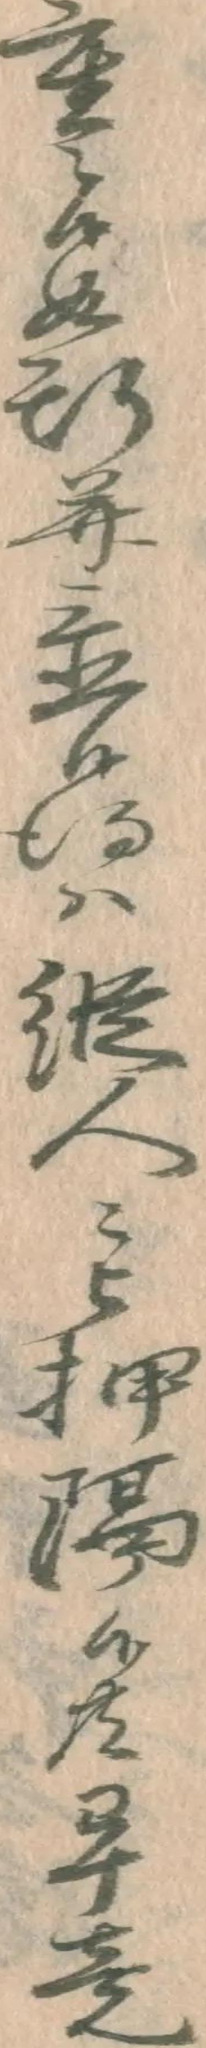重に候如斯幷置候得は縦人に被押隔候共畢竟
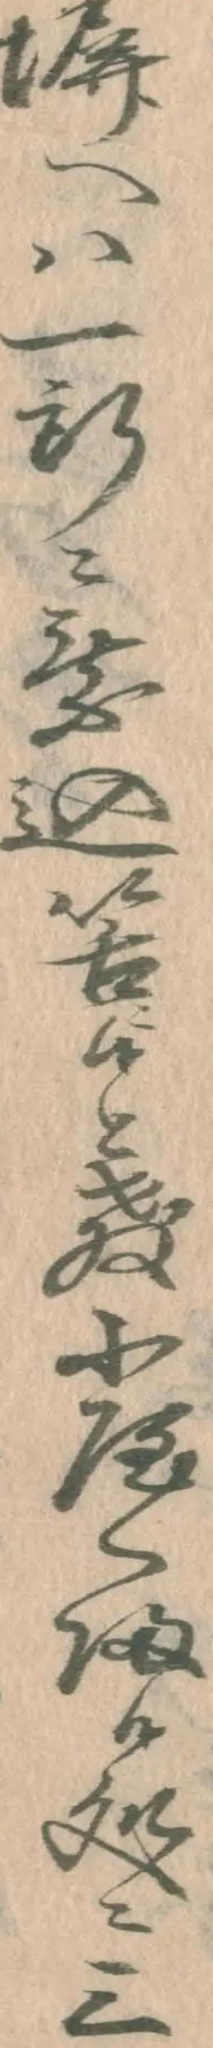塀へは一所に乗込筈候と教小屋へ帰候処に三
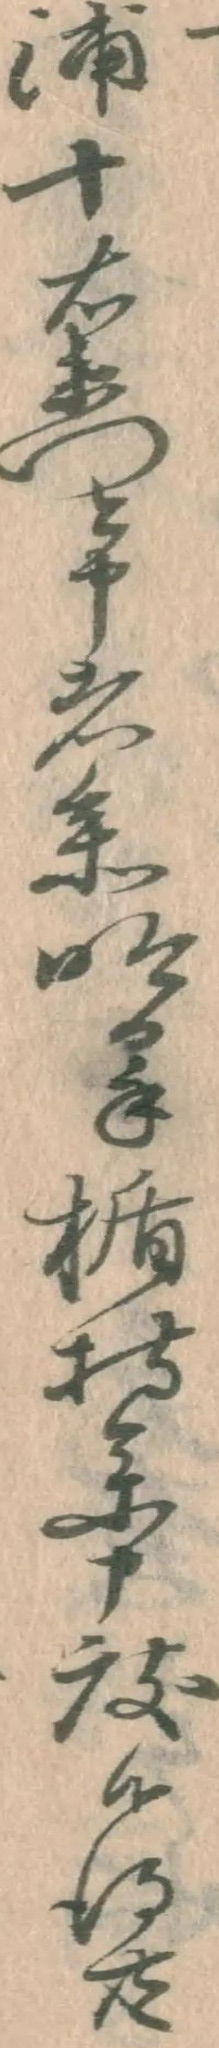浦十右衛門と申者参昨日手楯持参申度候得共
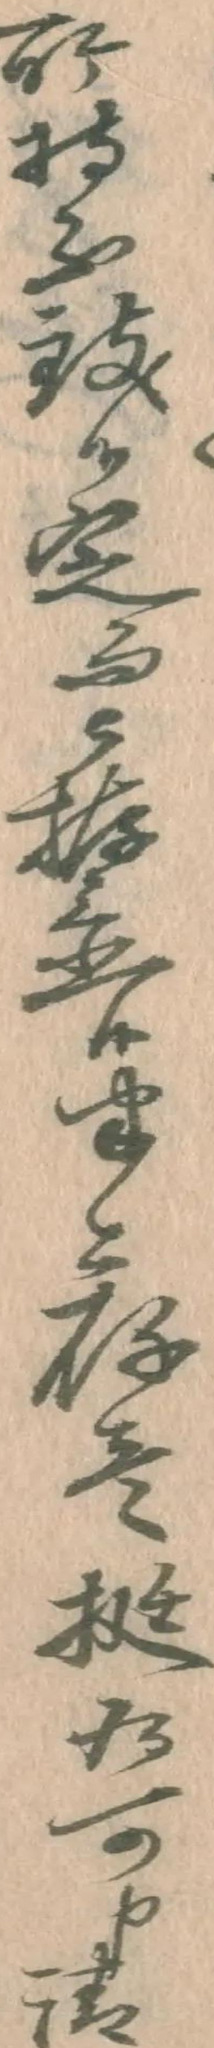所持ふ致候定而被拵置候半と存壱挺為可申請
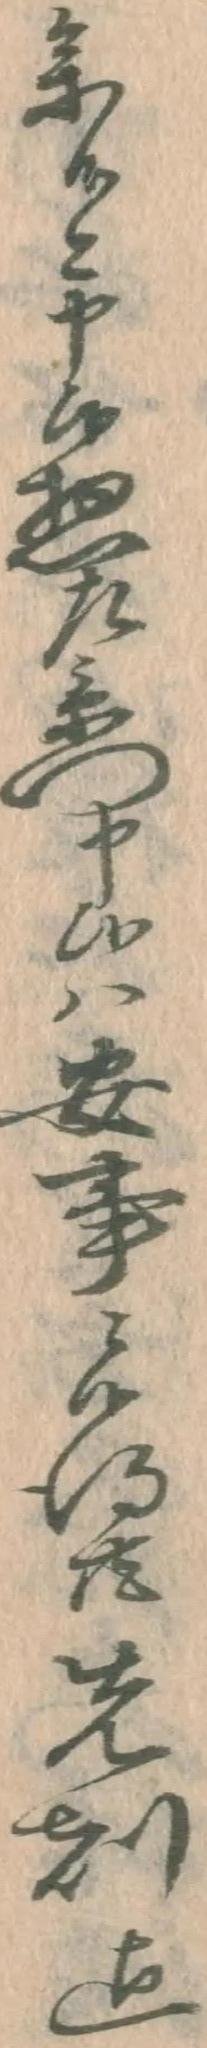参候と申候惣左衛門申候は安事に候得共先刻迄
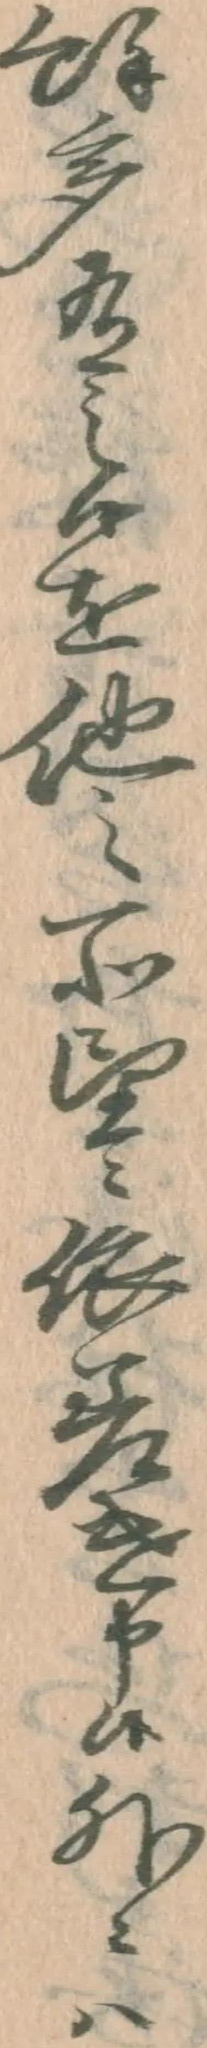余多有之候を他之所望に依差遣申候外には
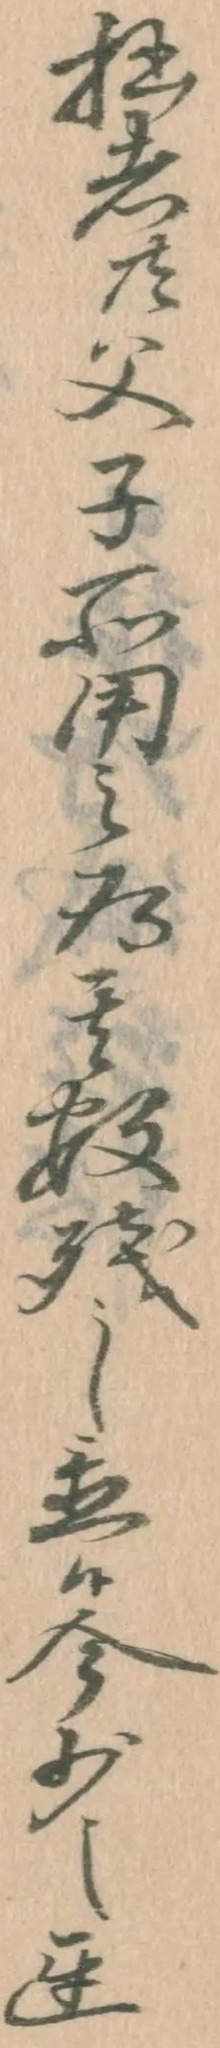拙者共父子所用之為其数残し置候今少し遅
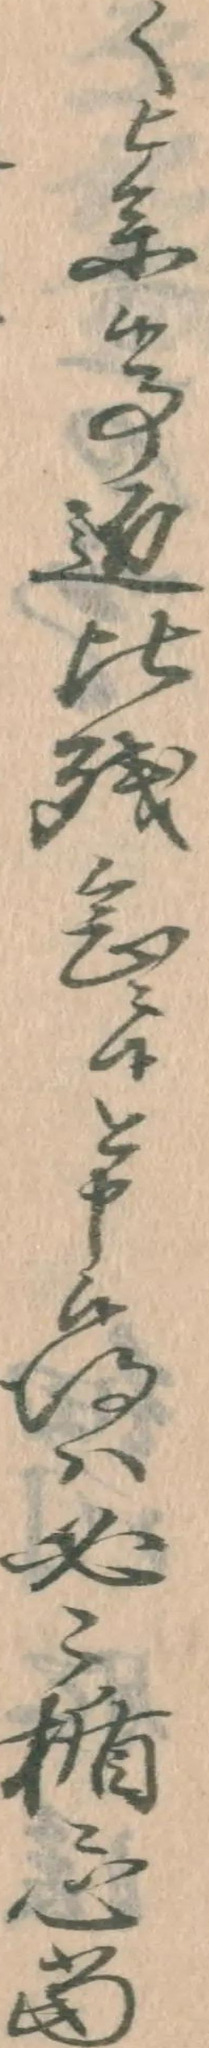く被参候事近比残急に候と申候得は必々楯に心当
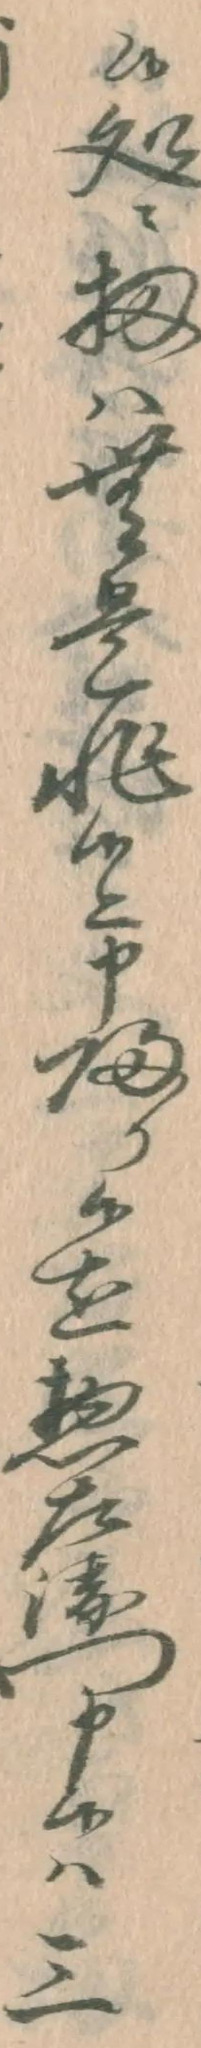候処に扨は無是非候と申帰り候を惣左衛門申候は三
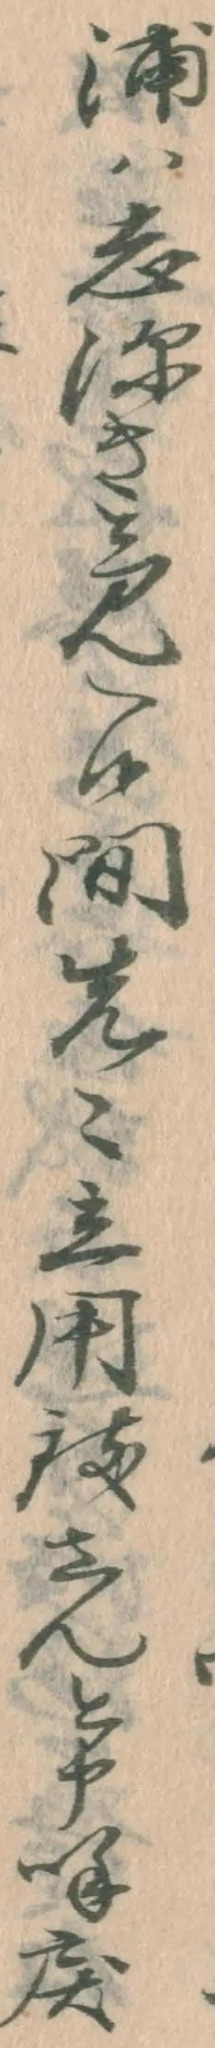浦は志深きと見へ候間先々立用致さんと申呼戻
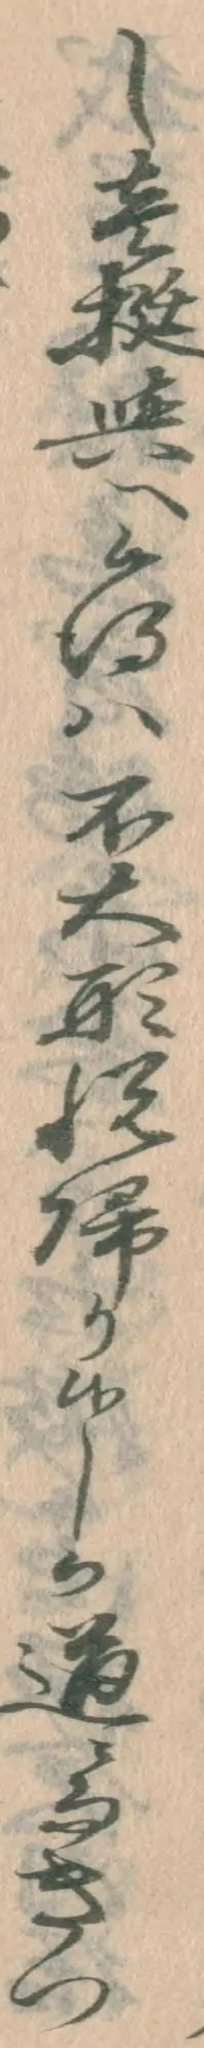し壱挺与へ候得は不大形悦帰り候しか道に而きつ
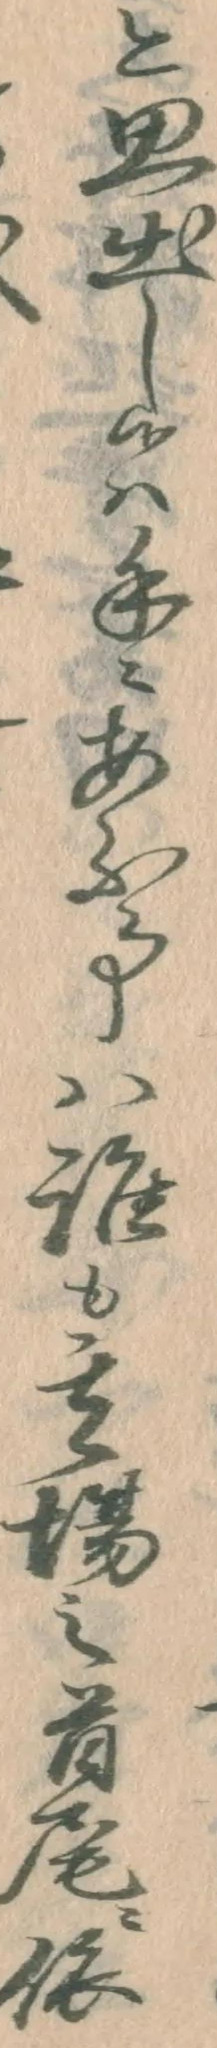と思出し候は手にあふ事は誰も其場之首尾に依
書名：切支丹御退治記 49巻. [5]
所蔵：国立国会図書館 National Diet Library, JAPAN
